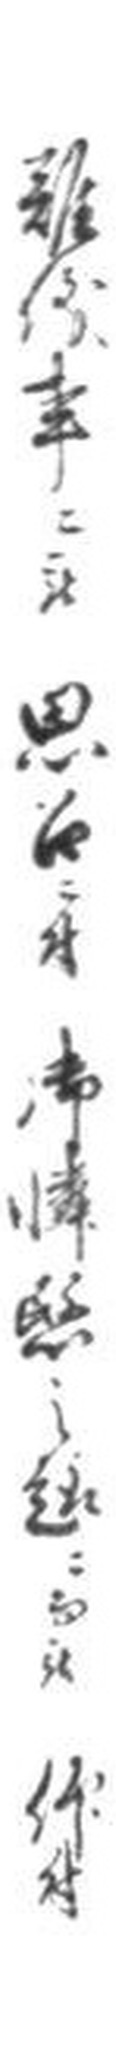難儀事ニ被思召ニ付御憐愍之趣ニ而被仰付
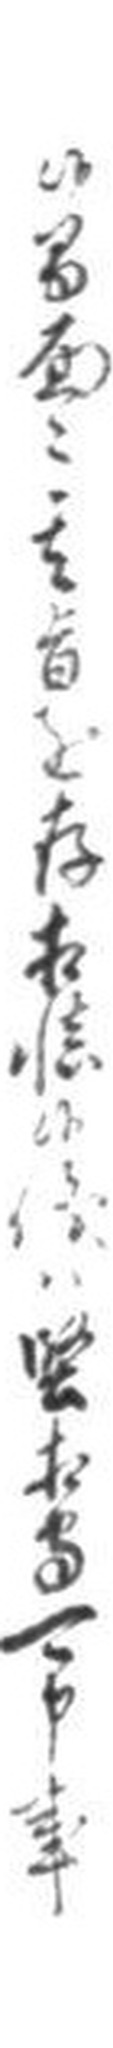候間面々其旨を存相慎候儀ハ堅相守可申事
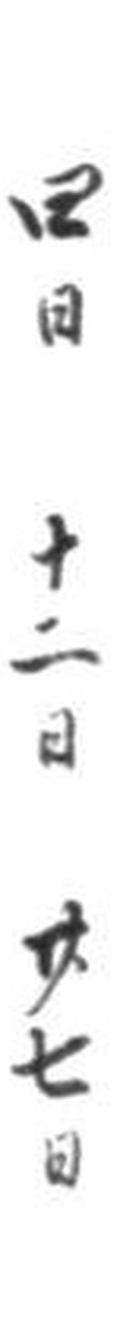四日十二日廿七日
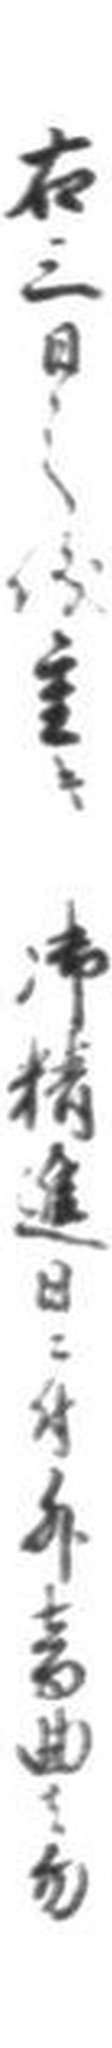右三日之儀重キ御精進日ニ付外音曲者勿
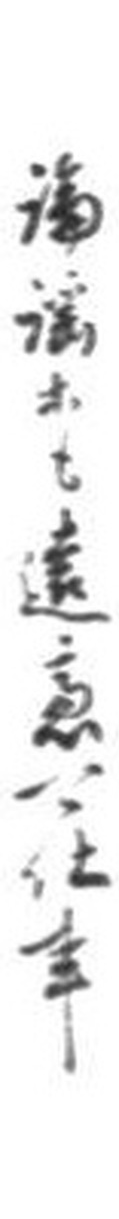論謡等も遠慮可仕事
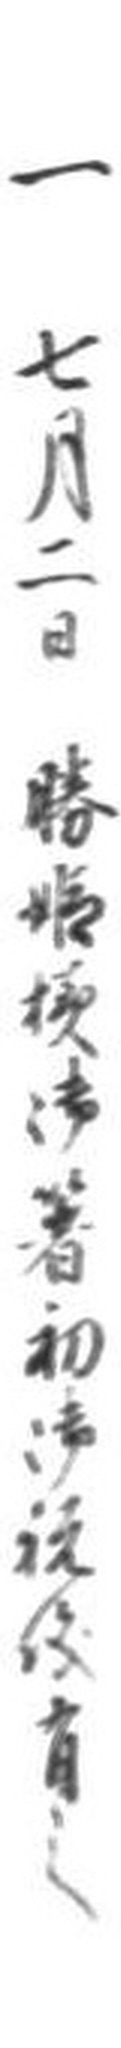一七月二日勝姫様御箸初御祝儀有之
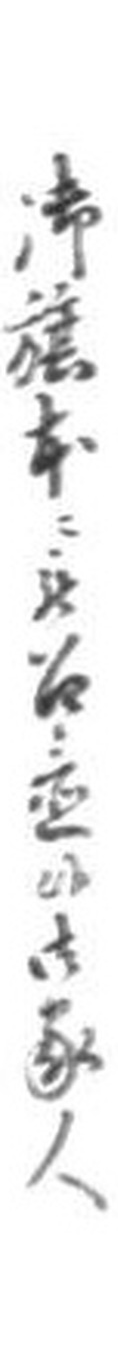御旗本ニ被召置候御家人
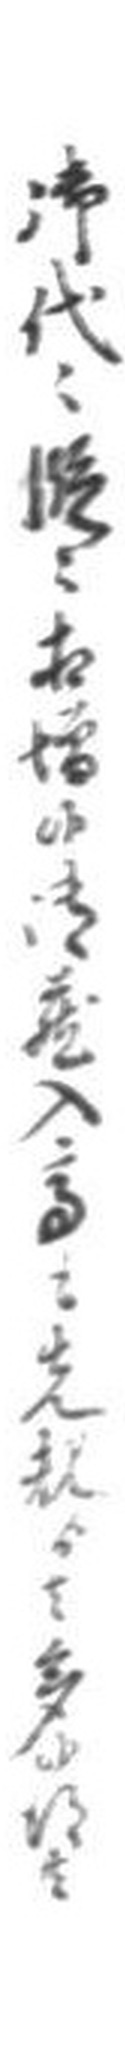御代々段々相増候御蔵入高も先規ゟ者多候得共
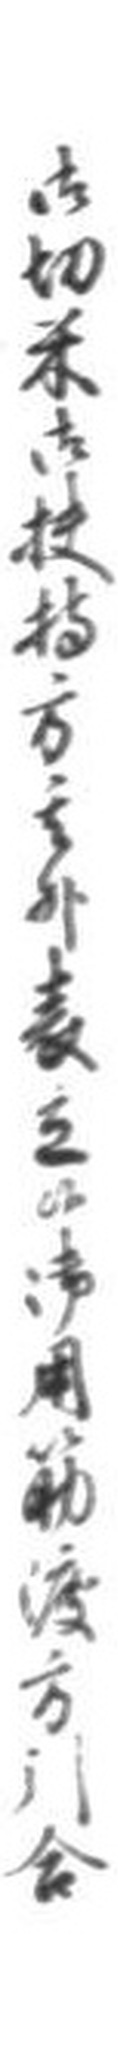御切米御扶持方其外表立候御用筋渡方引合

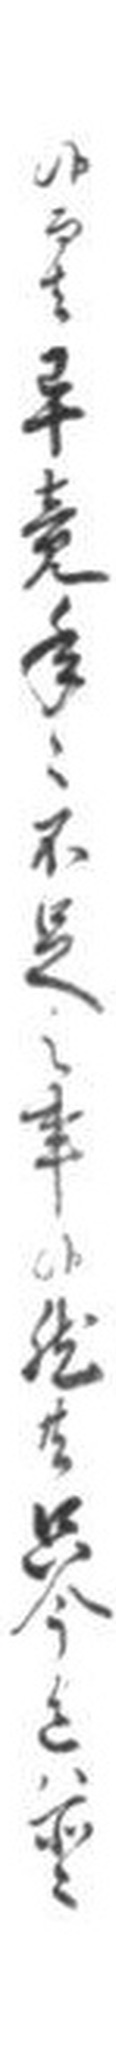候而者畢竟年々不足之事候然共只今迄ハ所々
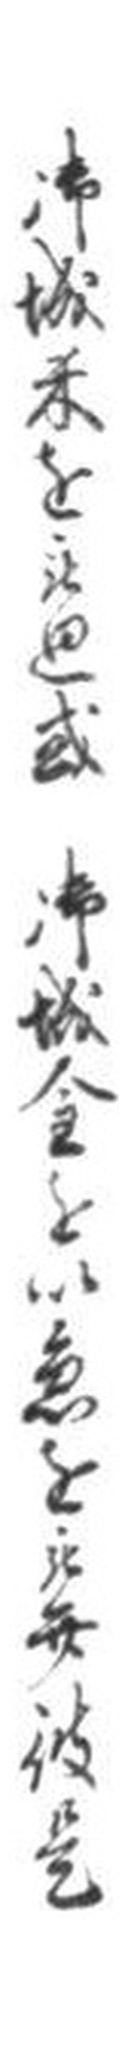御城米を被廻或御城金を以急を被弁彼是
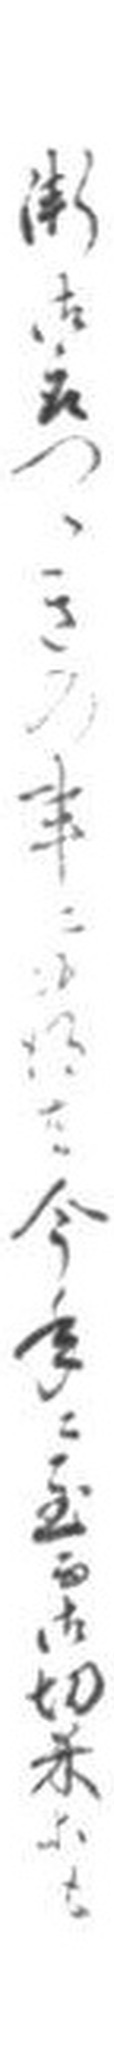漸御取つゝきの事ニ候得共今年ニ至而御切米等も
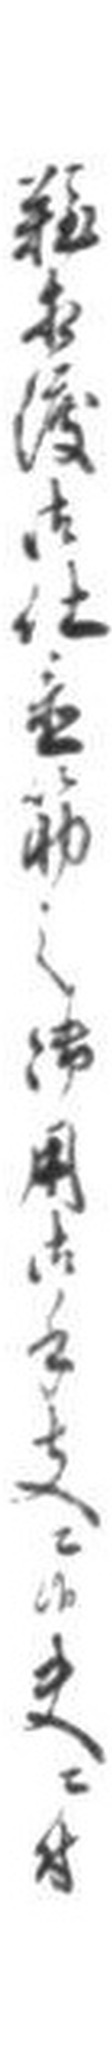難相渡御仕置筋之御用御手支ニ候夫ニ付
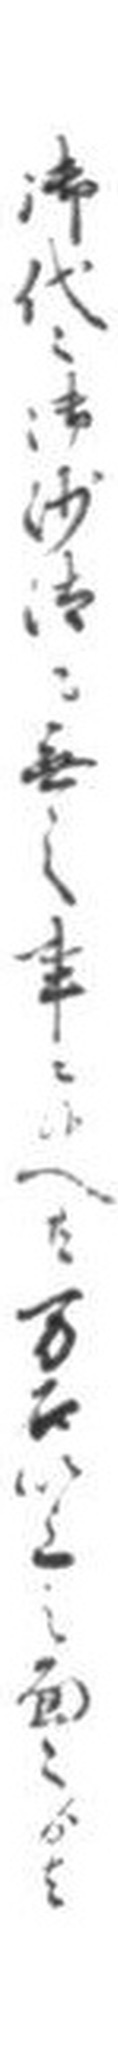御代々御沙汰も無之事ニ候へ共万石以上之面々ゟ者
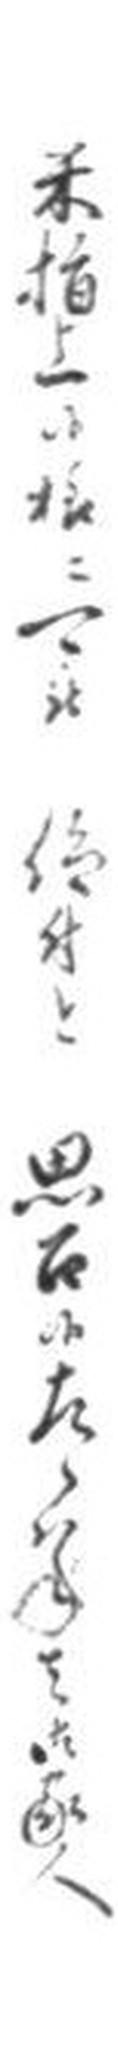米指上候様ニ可被仰付と思召候左候半者御家人
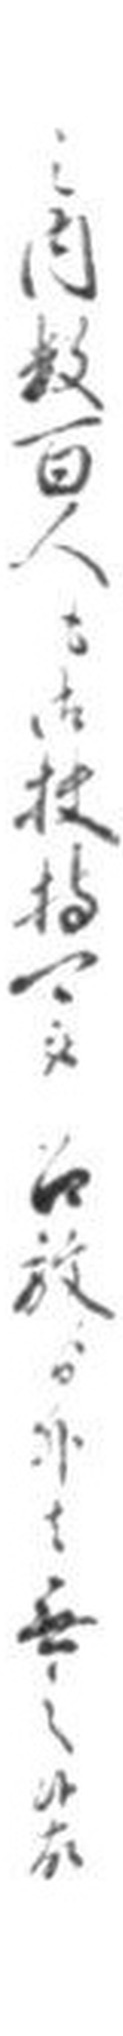之内数百人も御扶持可被召放ゟ外者無之候故
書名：家譜 三十五 宗昌公 従享保六年到同七年
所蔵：福井県文書館 Fukui Prefectural Archives
